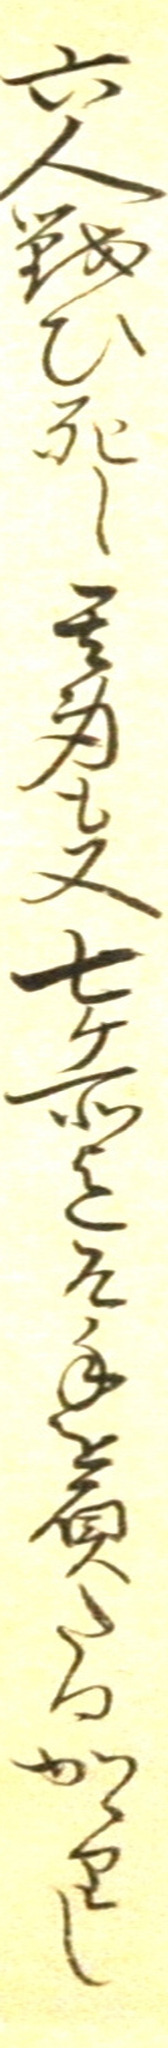六人戦ひ死し其身も又七ヶ所迄そ手を負たるかゝりし
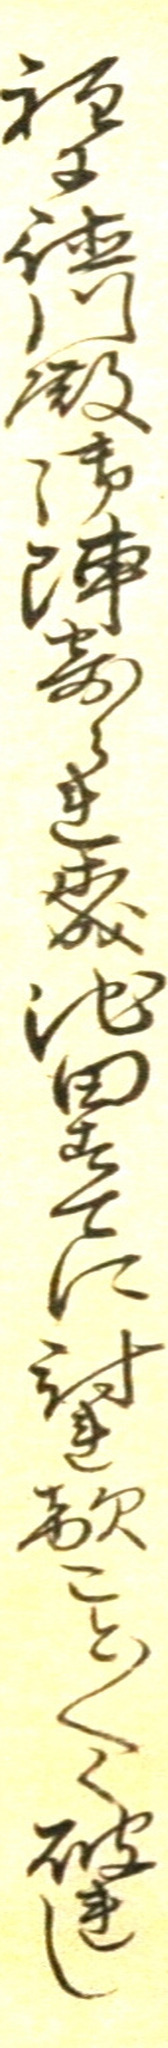程に徳川殿御陣寄られ森池田すてに討れ敵こと〳〵く破れし

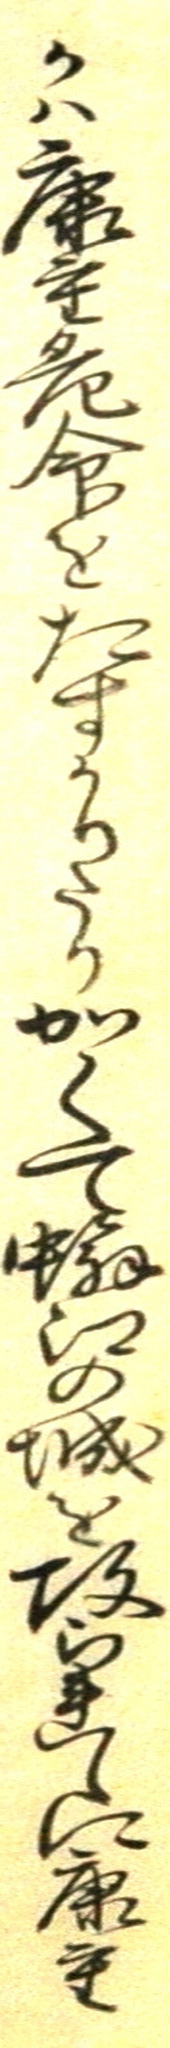かは康重危命をたすかりたりかくて蟹江の城を攻られしに康重
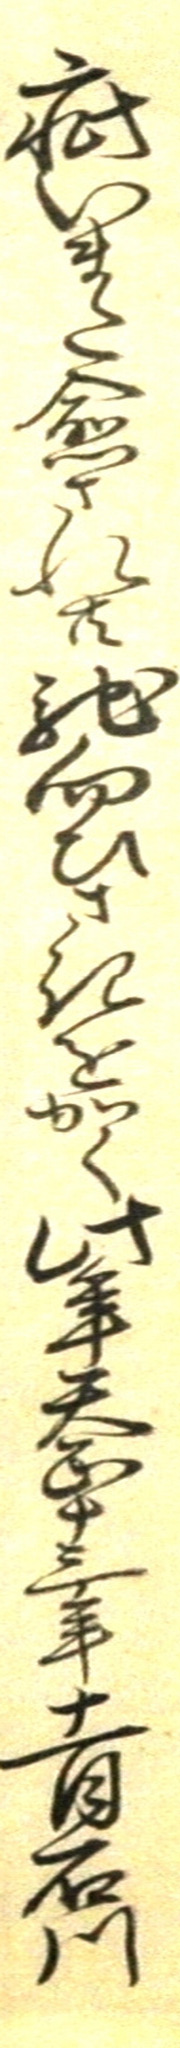疵いまた愈され共馳向ひさきをかく此年天正十三年十一月石川
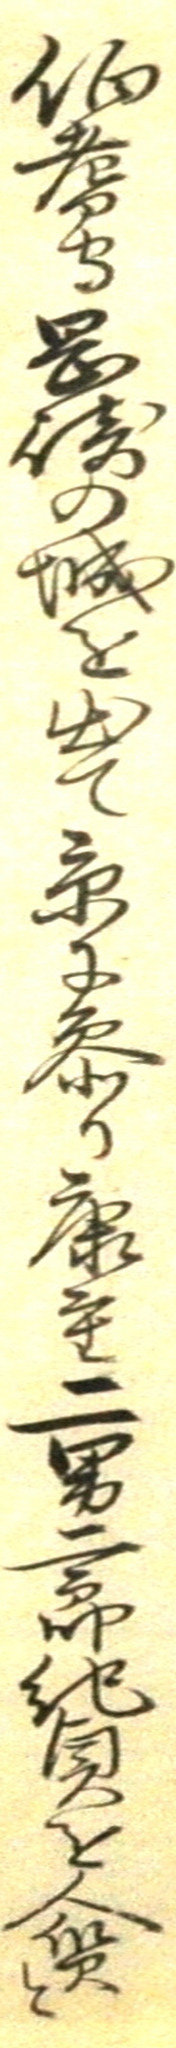伯耆守岡崎の城を出て京に参り康重二男二郎紀貞を人質と
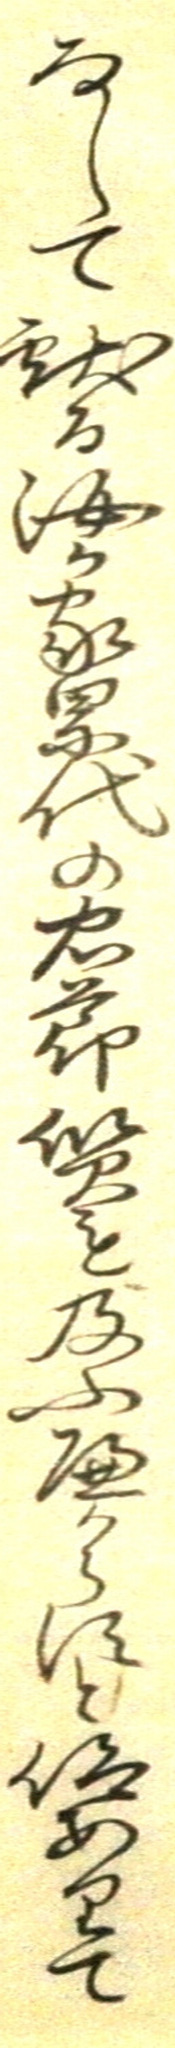なして献る汝か家累代の忠節質も及ふへからすと仰ありて
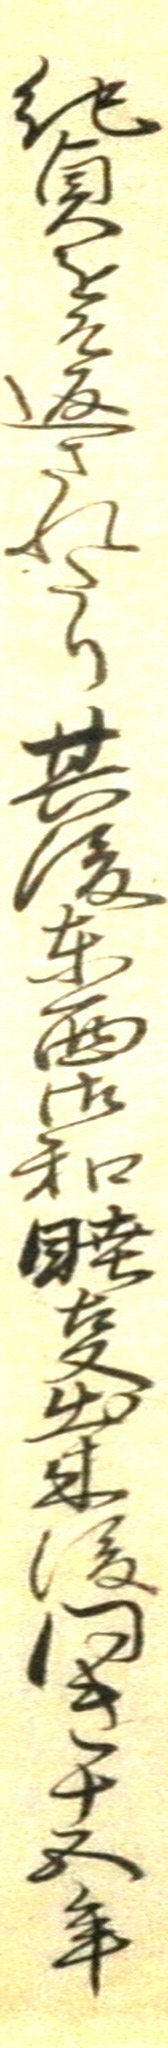紀貞をそ返されたり其後東西御和睦事出来後同き十五年
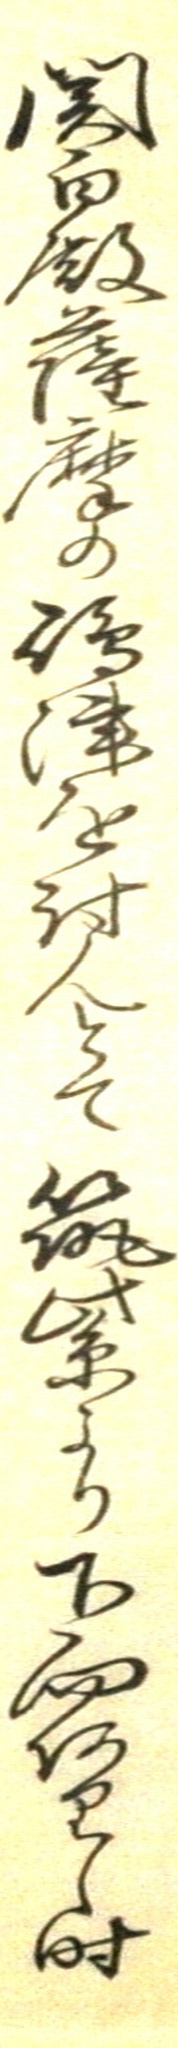関白殿薩摩の島津を討んとて築紫より下向ありし時
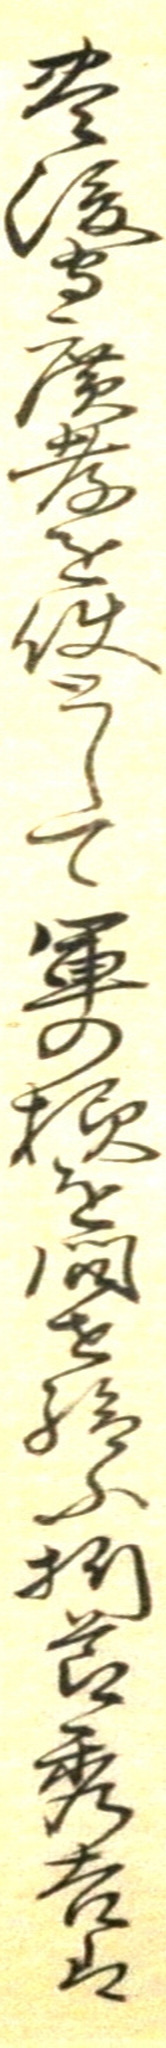豊後守廣孝を使として軍の様を問せ給ふ折節秀吉は
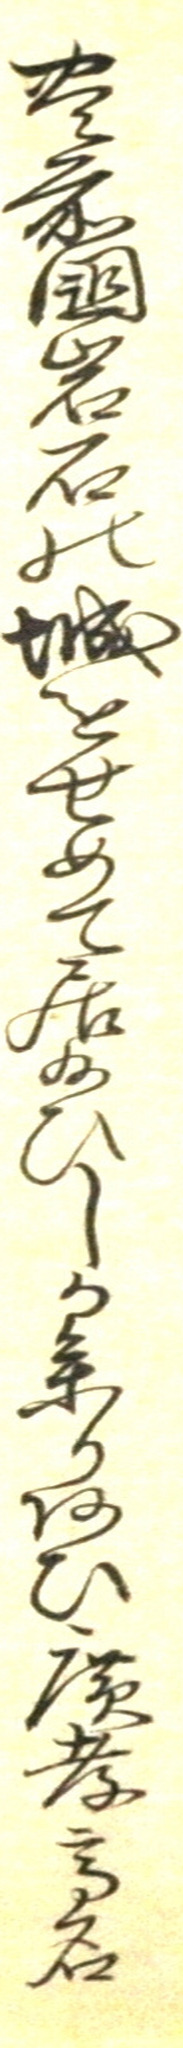豊前国岩石の城をせめて居給ひしか参りあひ廣孝高名
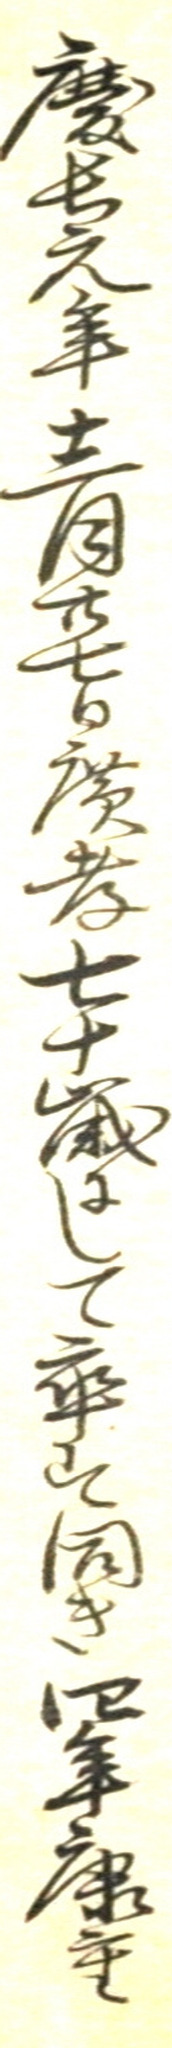慶長元年十二月廿七日廣孝七十歳にして卒す同き四年康重
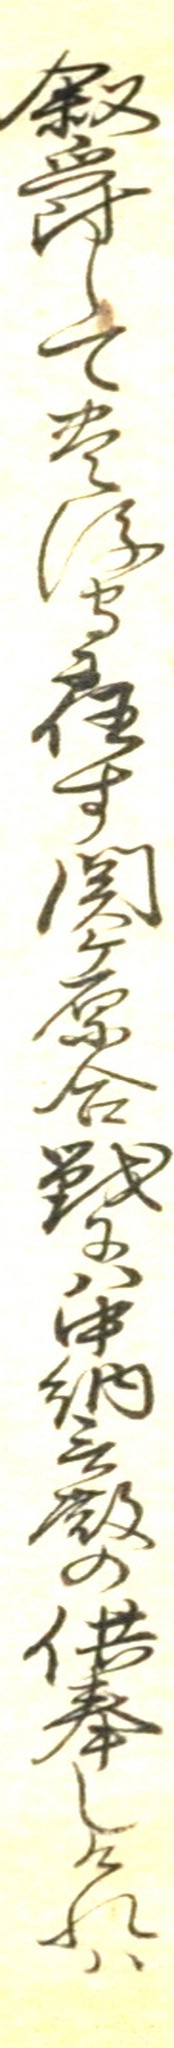叙爵して豊後守に任す関ヶ原合戦には中納言殿の供奉しけれは
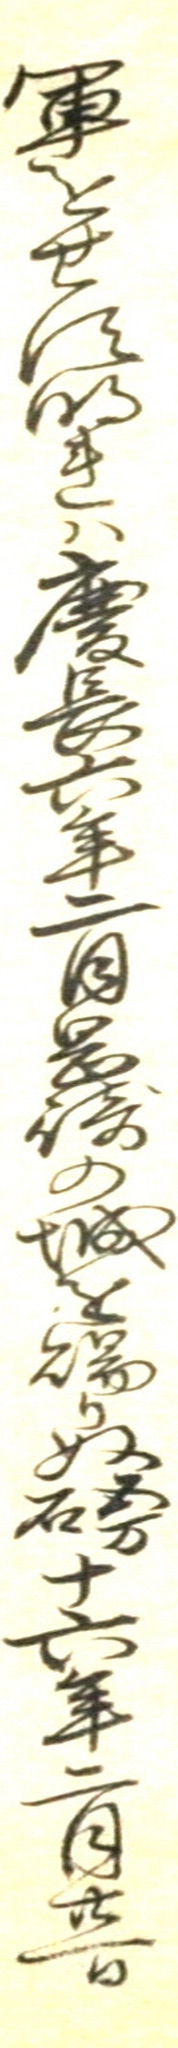軍をせす明れは慶長六年二月岡崎の城を賜りぬ五万石十六年二月廿一日
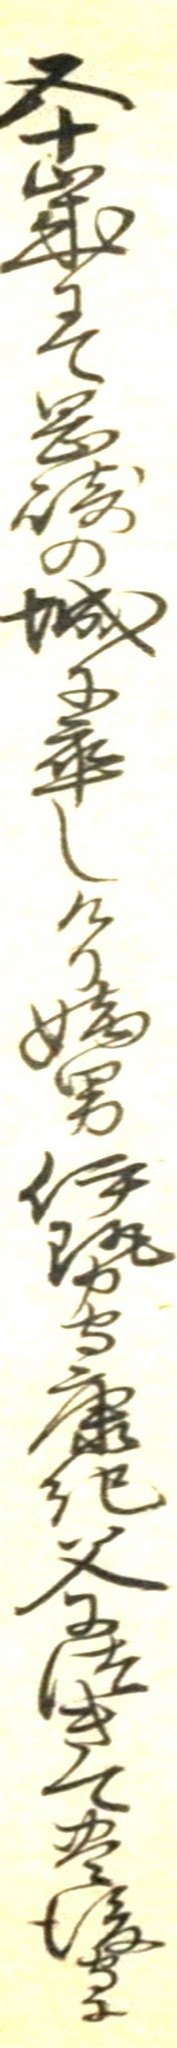五十歳にて岡崎の城に卒しけり嫡男伊勢守康紀父につきて豊後守に
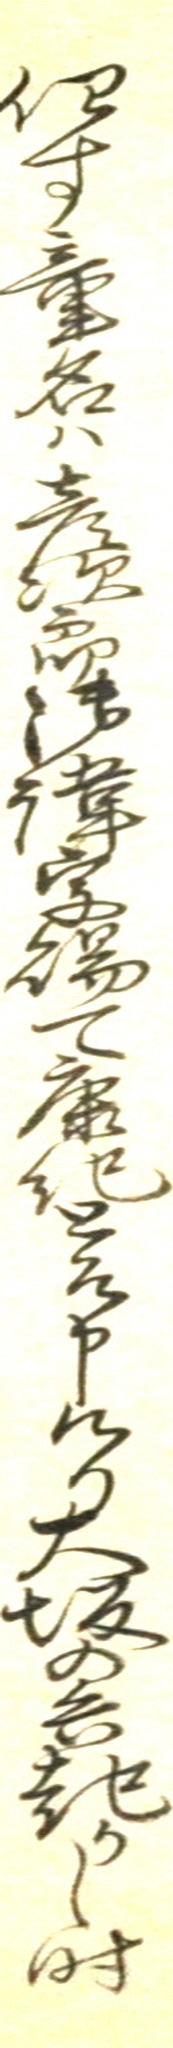任す童名は彦次郎御諱字賜て康紀とそ申けり大坂の兵起りし時
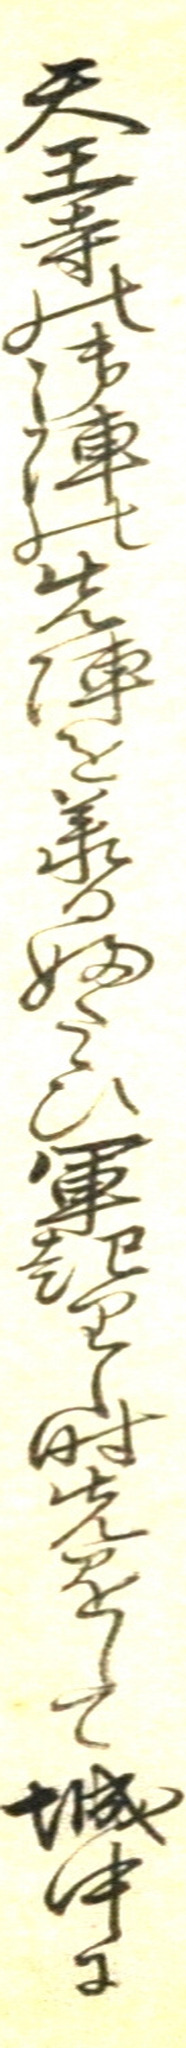天王寺の御陣の先陣を承るふたゝひ軍起りし時先懸して城中に
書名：藩翰譜（四・上）
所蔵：伊那市立高遠町図書館・合同会社AMANE
